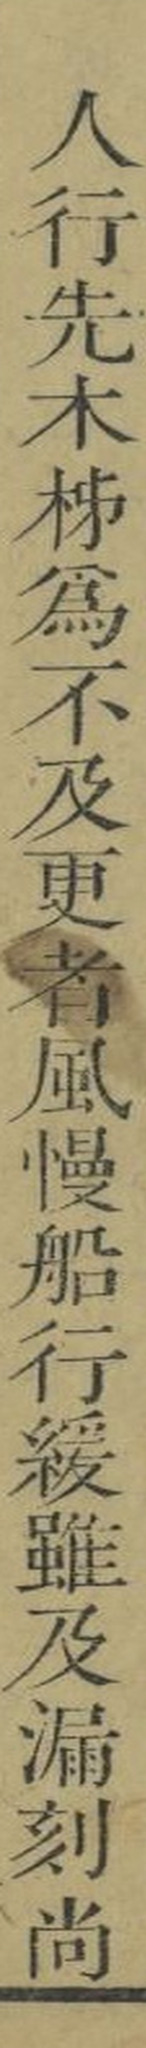人行先木柹爲不及更者風慢船行緩雖及漏刻尚
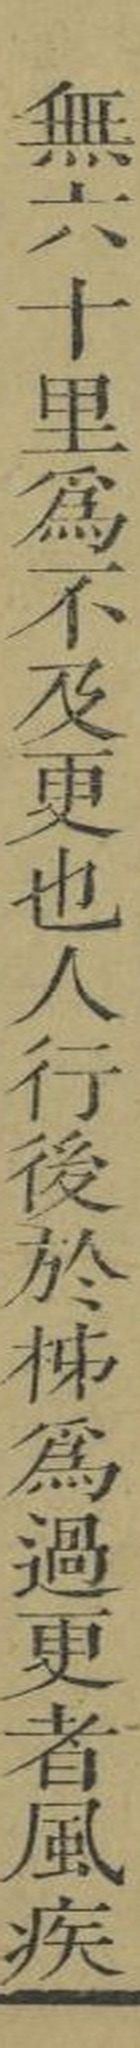無六十里爲不及更也人行後於柹爲過更者風疾
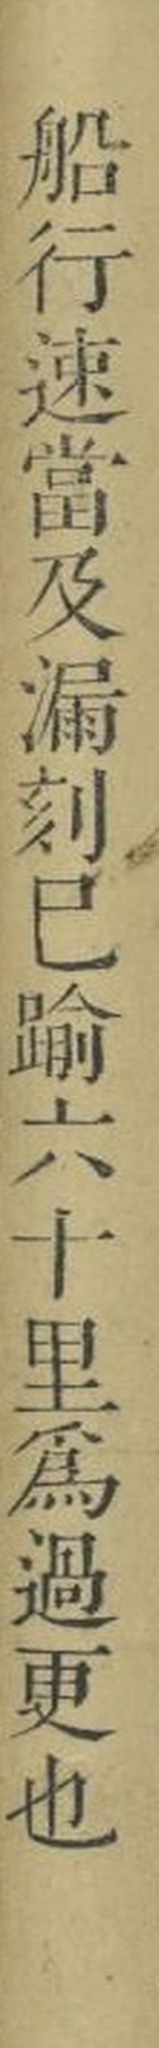船行速當及漏刻巳踰六十里爲過更也

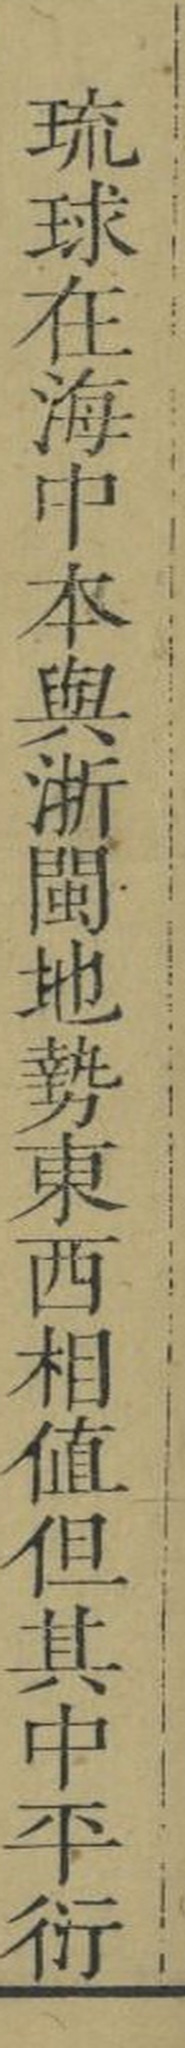琉球在海中本與浙閩地勢東西相値但其中平衍
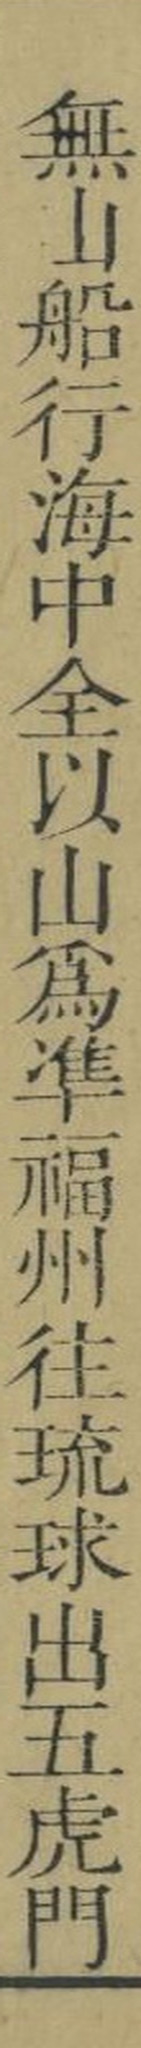無山船行海中全以山爲凖福州往琉球出五虎門
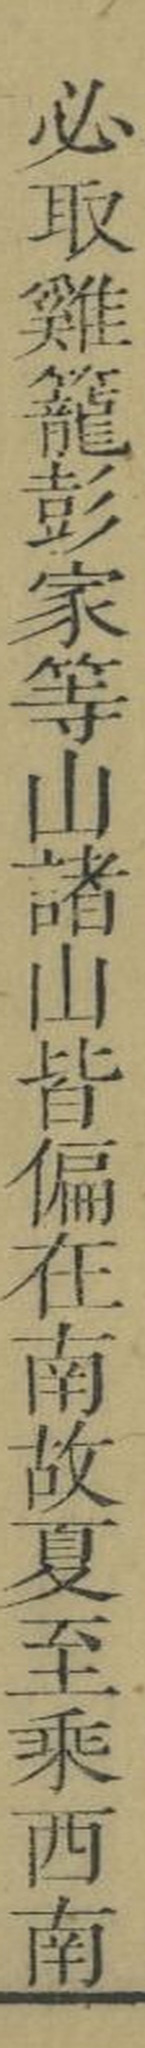必取雞籠彭家等山諸山皆偏在南故夏至乘西南
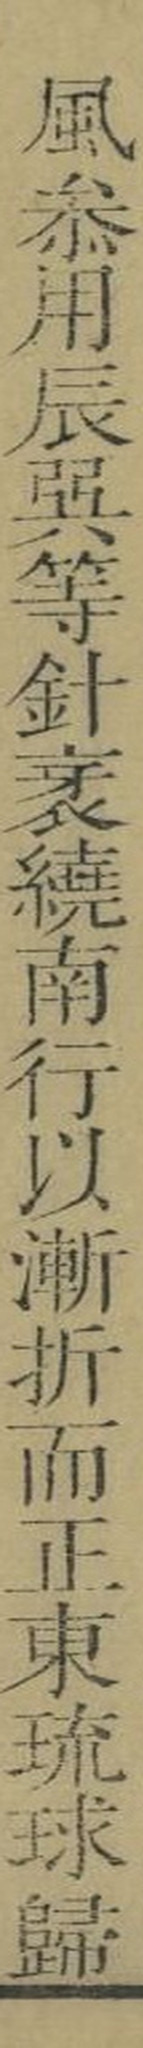風叅用辰巽等針袤繞南行以漸折而正東琉球歸
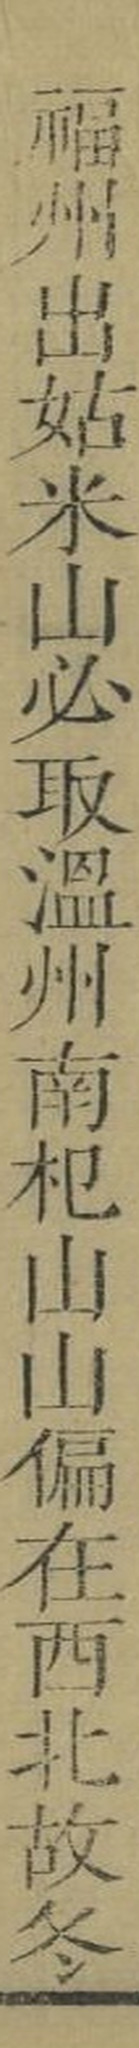福州出姑米山必取溫州南杞山山偏在西北故冬
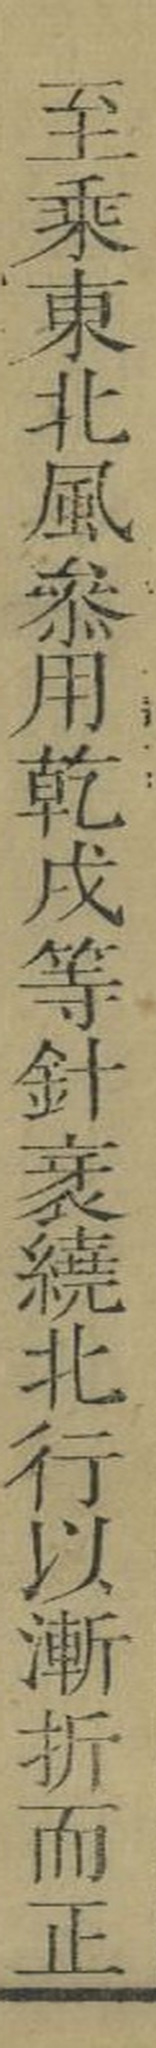至乘東北風叅用乾戌等針袤繞北行以漸折而正
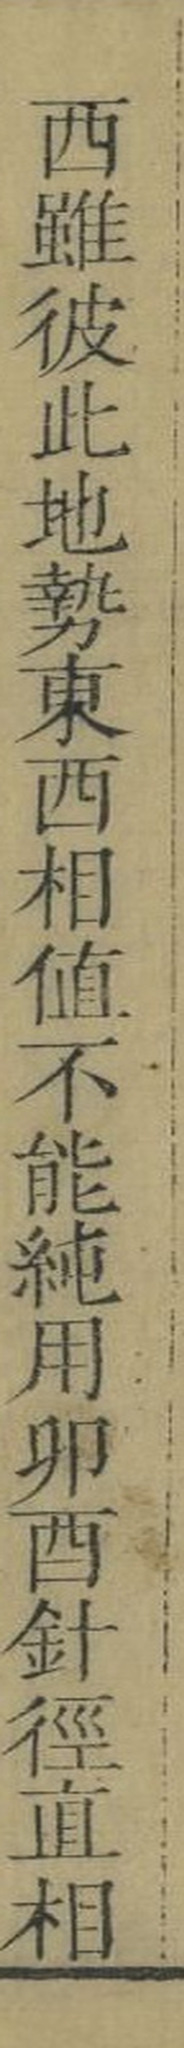西雖彼此地勢東西相値不能純用卯酉針徑直相
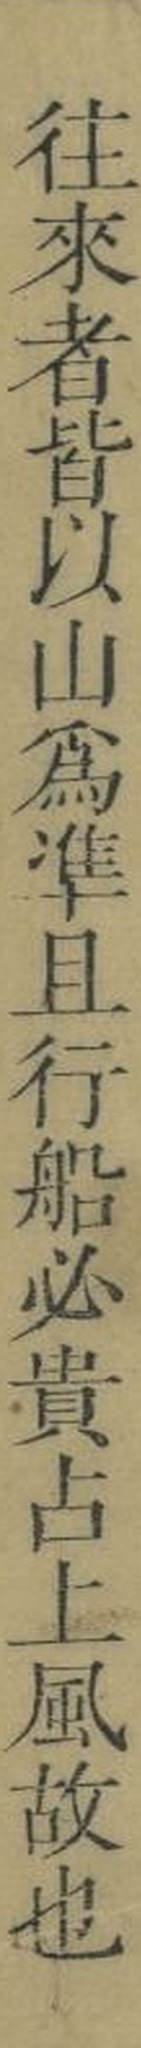往來者皆以山爲凖且行船必貴占上風故也

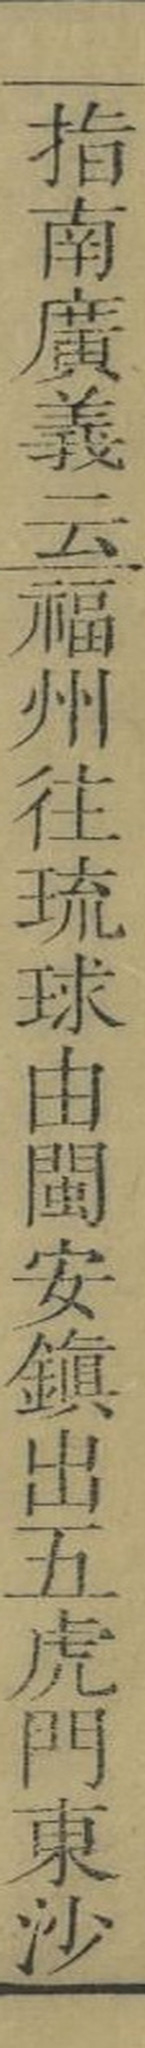[指南廣義云]福州往琉球由閩安鎭出五虎門東沙
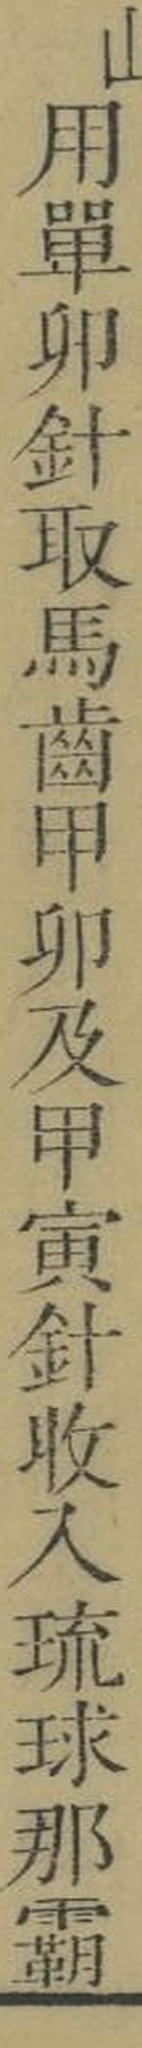山用單卯針取馬齒甲卯及甲寅針收入琉球那霸
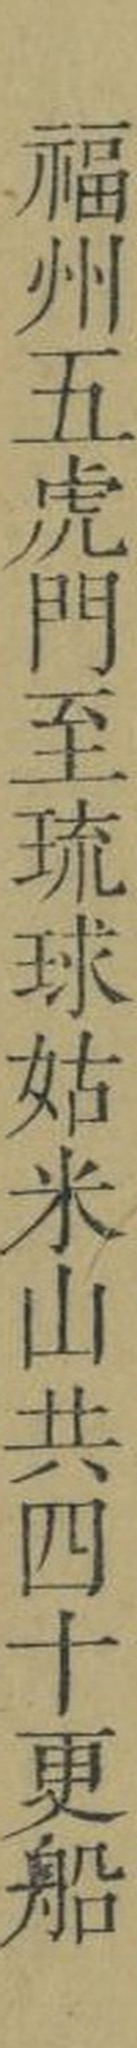福州五虎門至琉球姑米山共四十更船
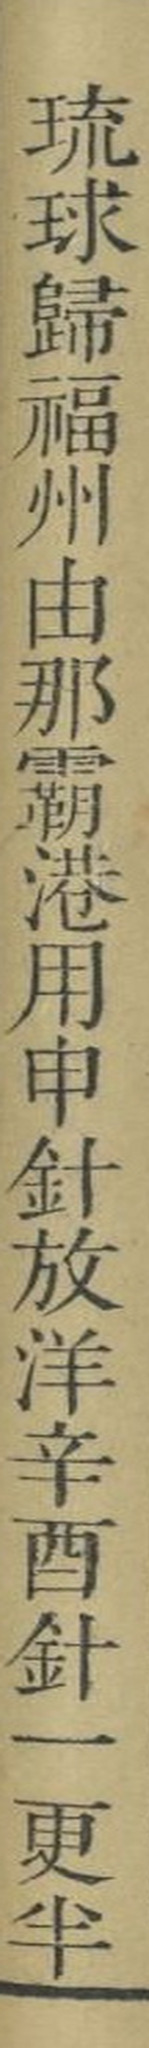琉球歸福州由那霸港用申針放洋辛酉針一更半
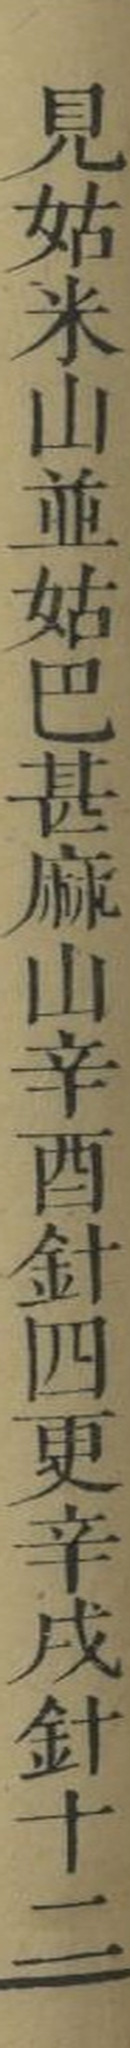見姑米山並姑巴甚麻山辛酉針四更辛戌針十二
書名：中山伝信録 巻一
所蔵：University of the Ryukyus Library
